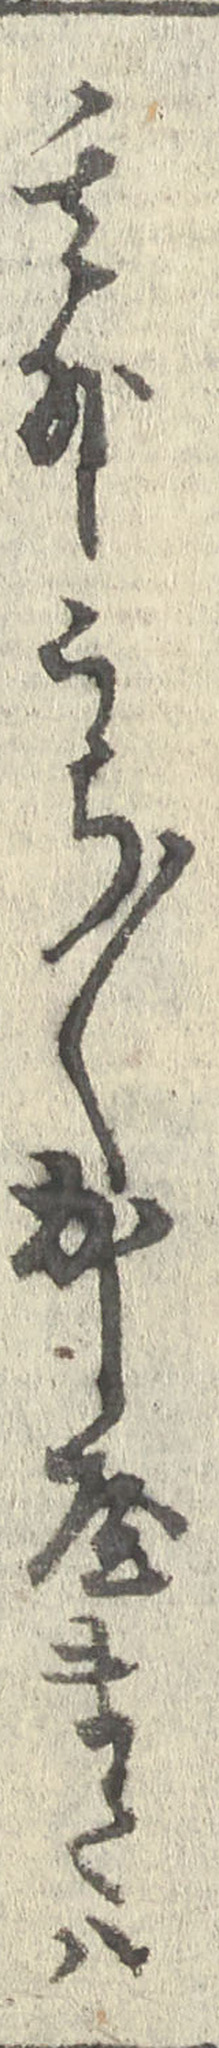其外うち〳〵かし屋または
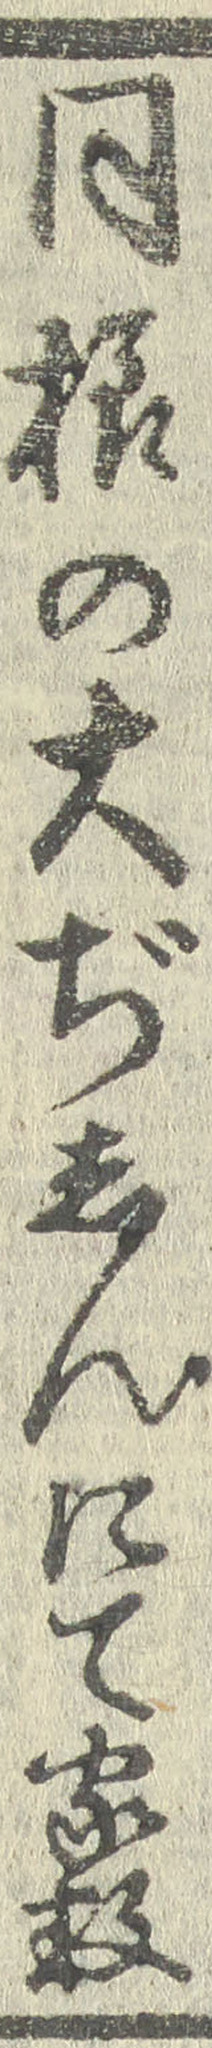同様の大ぢしんにて家数
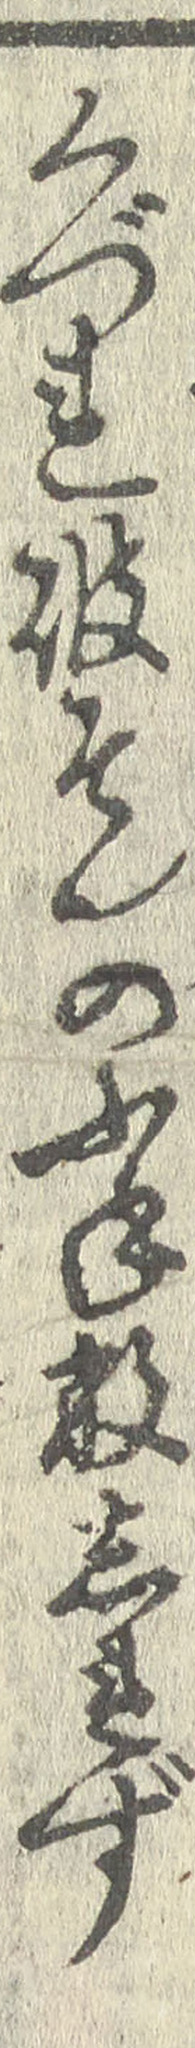くづれ破そんのふね数しれず
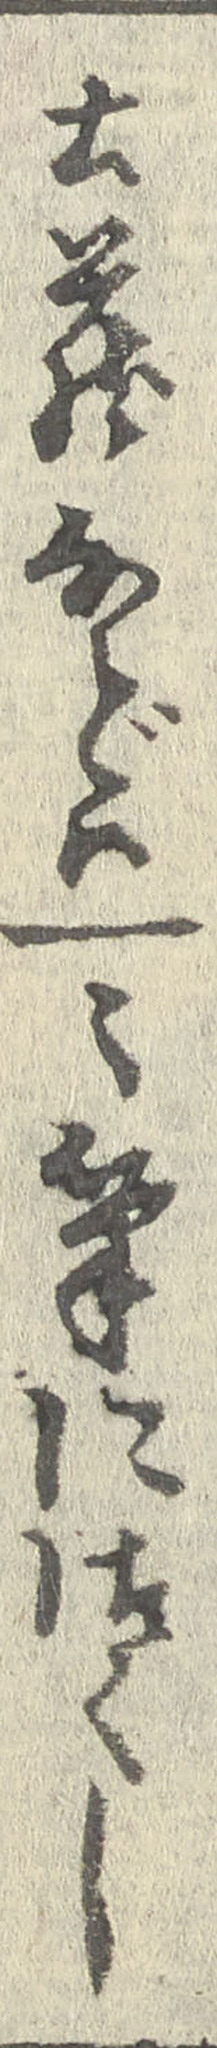土蔵などは一々筆につくし
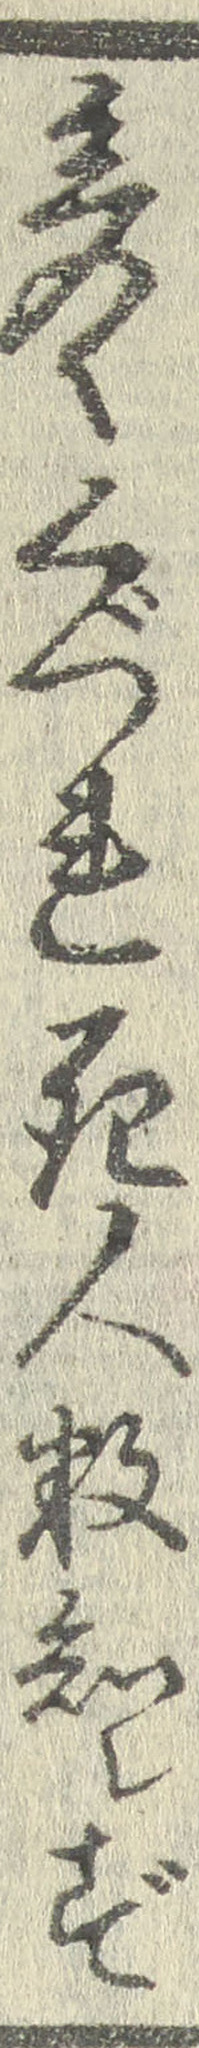多くくづれ死人数知れず
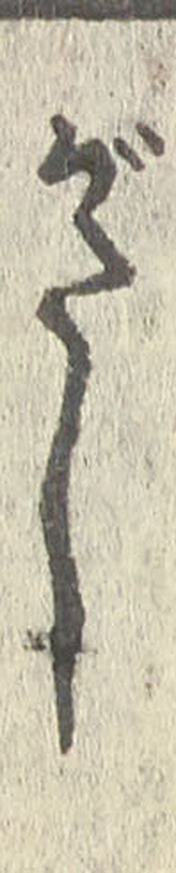がたし
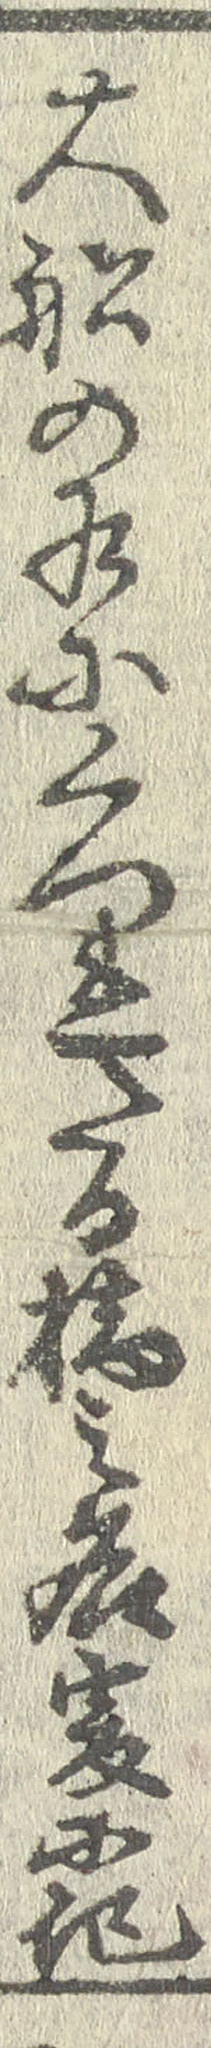大船の為にくつれたる橋の名爰に記
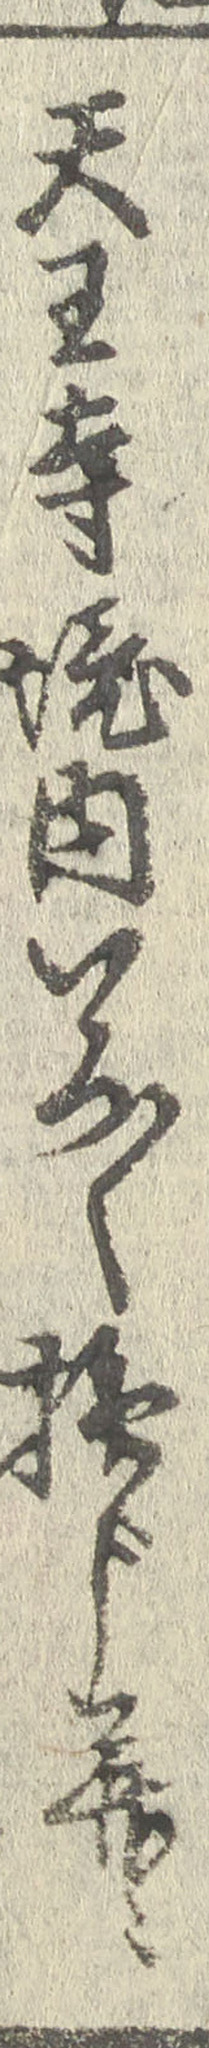天王寺境内いろ〳〵損じ幷に
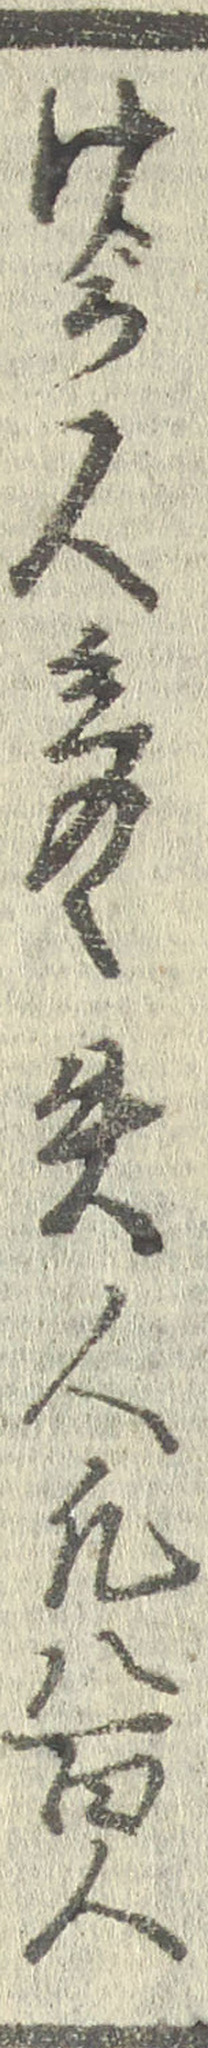けが人多く失人凡八百人
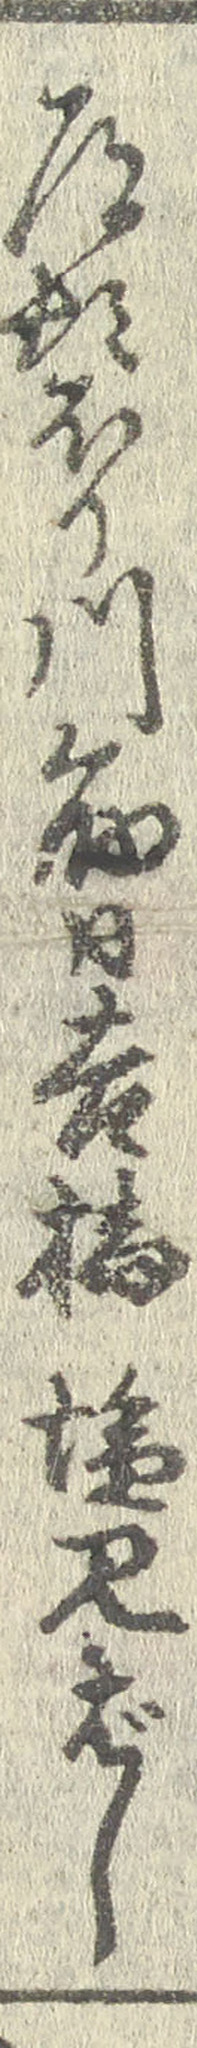道頓ほり川筋日吉橋塩見ばし
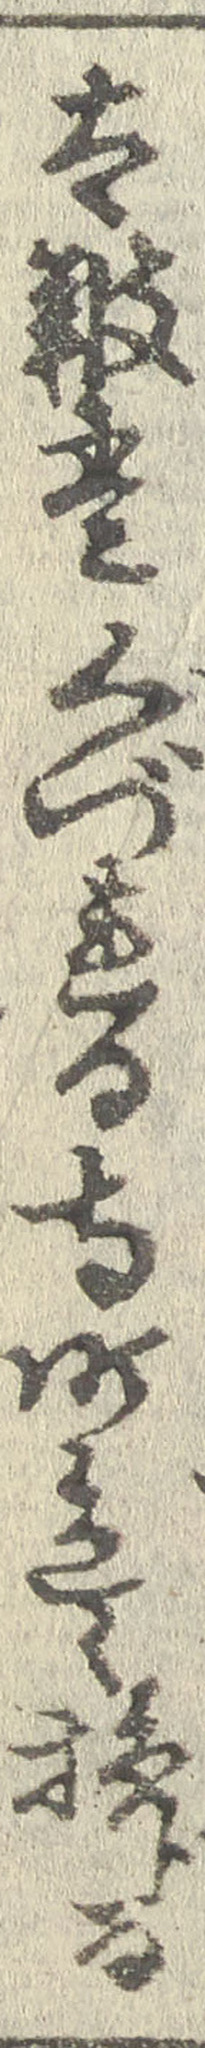太鼓堂くづれる寺町色々損じる
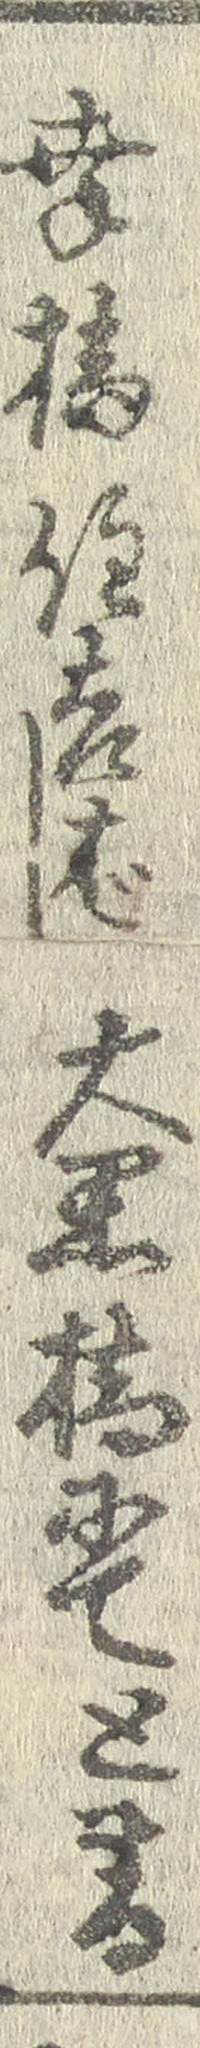幸橋住吉ばし大黒橋にてとまる
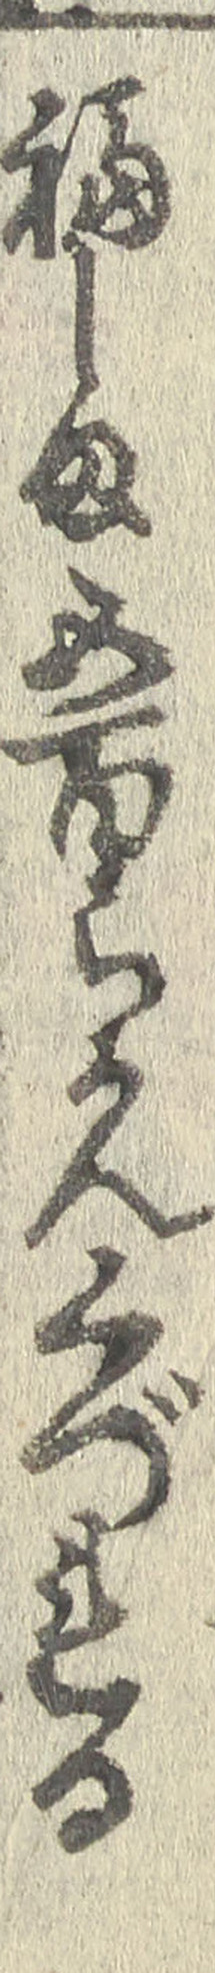福しま五百らかんくづれる
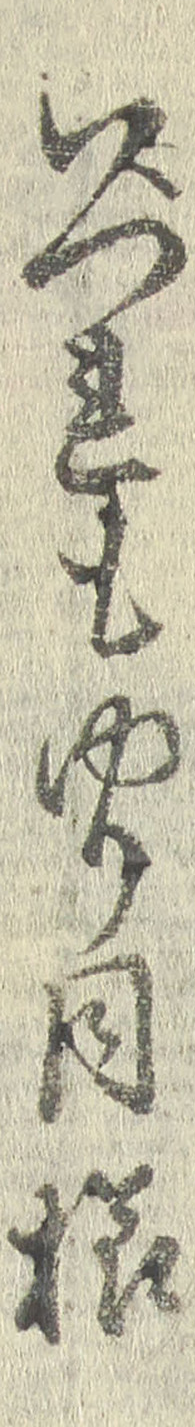いづれもゆり同様
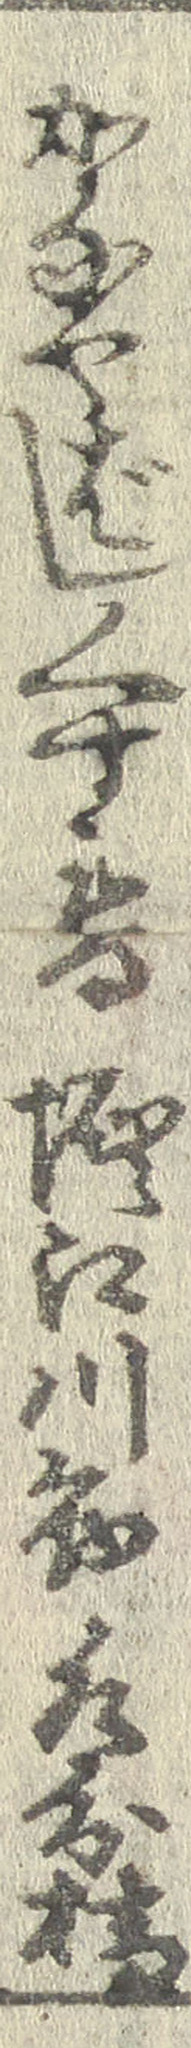かなやばしくすれる堀江川筋水分橋
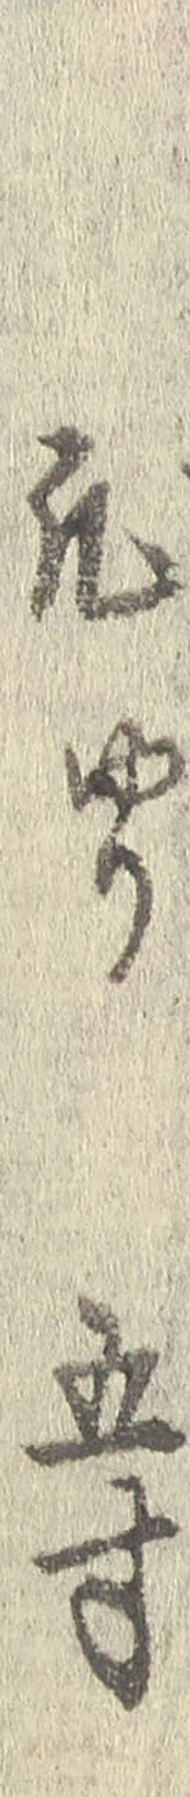凡ゆり五寸
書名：聞書諸国并大阪大地震つなみ
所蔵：東京大学総合図書館 General Library in the University of Tokyo, JAPAN
